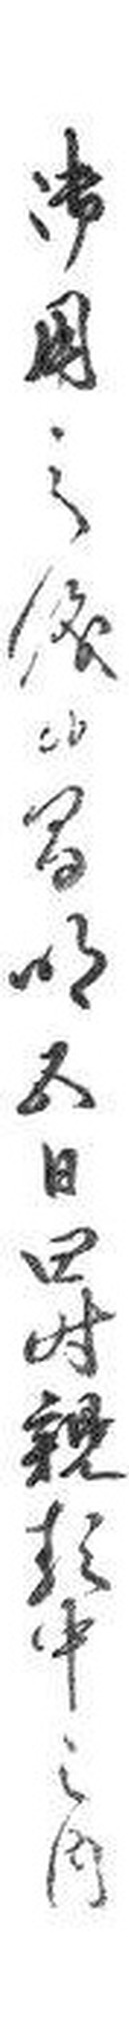御用之儀候間明五日四時親類中之内
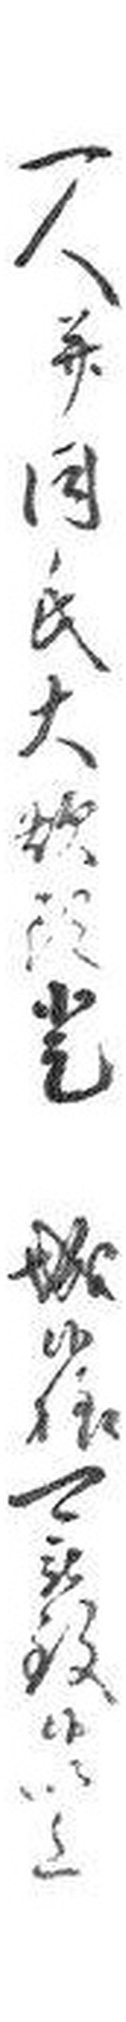一人幷同氏大炊頭登城候様可被致候以上
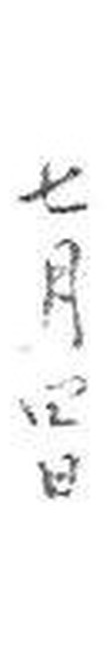七月四日
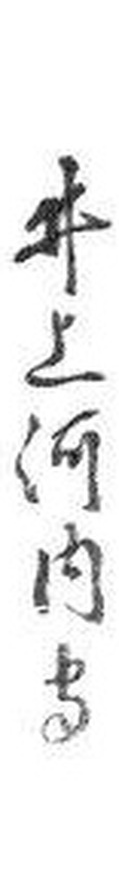井上河内守
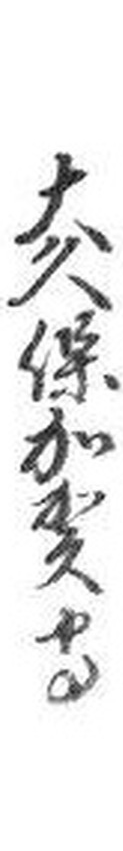大久保加賀守
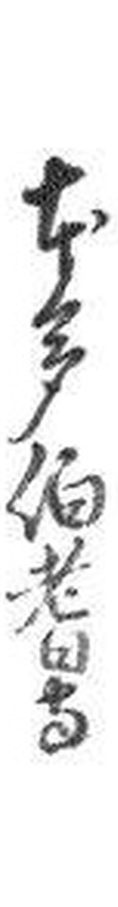本多伯耆守
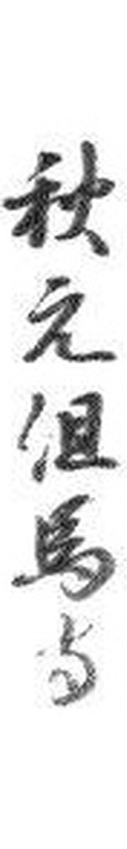秋元但馬守
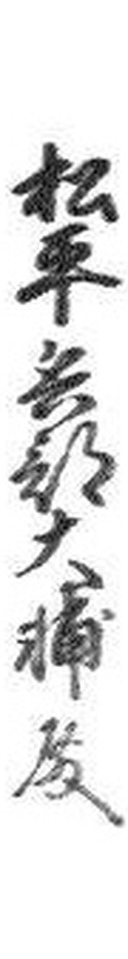松平兵部大輔殿
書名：家譜 二十五 吉品公 従宝永六年到同七年
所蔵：福井県文書館 Fukui Prefectural Archives
